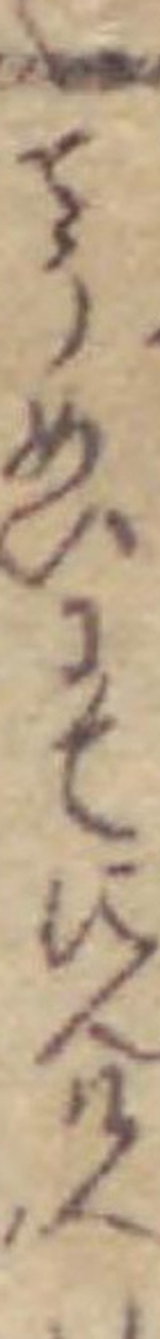てうめいにてにんけん
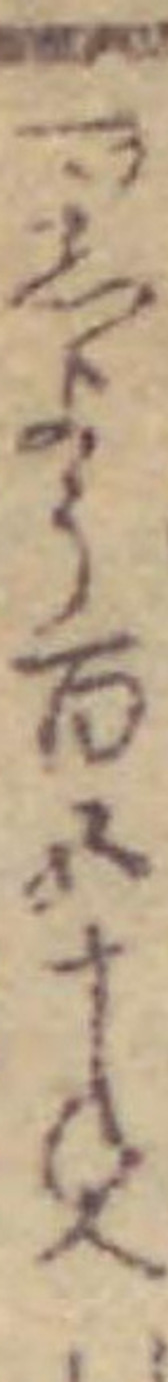一ッしよう百五十ねん
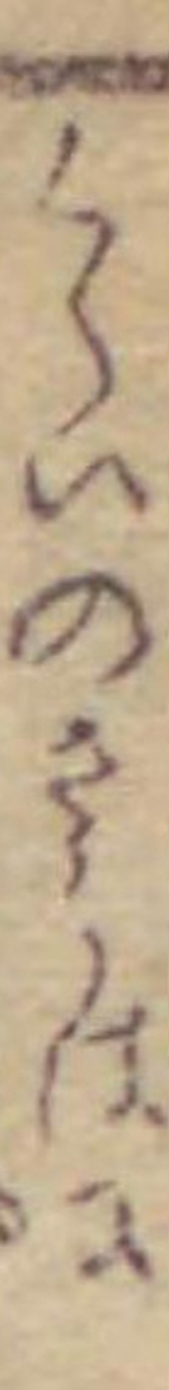くらいのさうはに
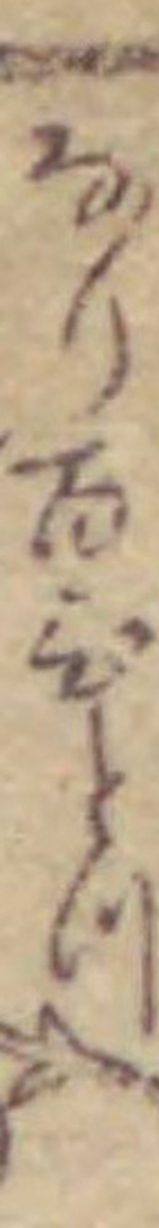なり百ひとつ
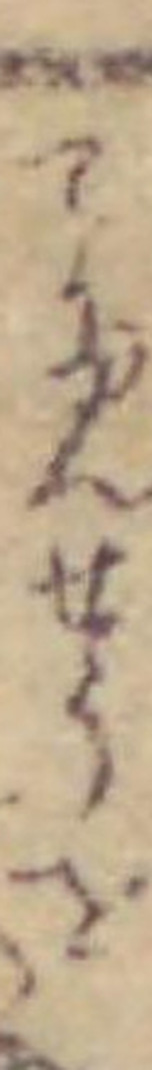てたんせうを
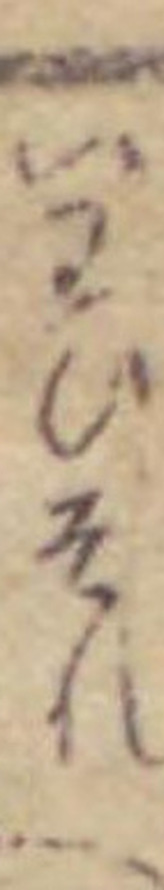いわひそれ
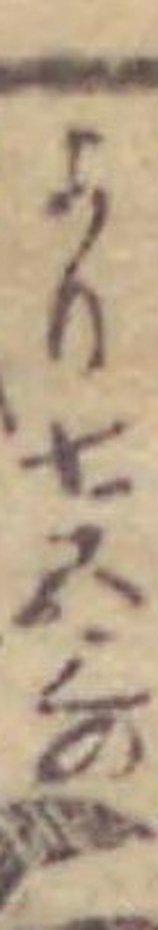より七五三の
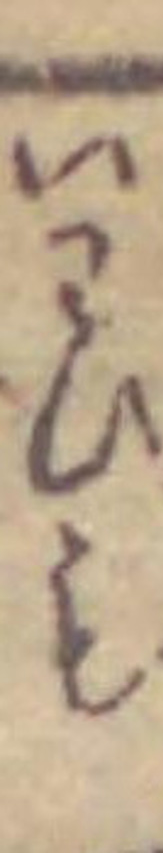いわひも
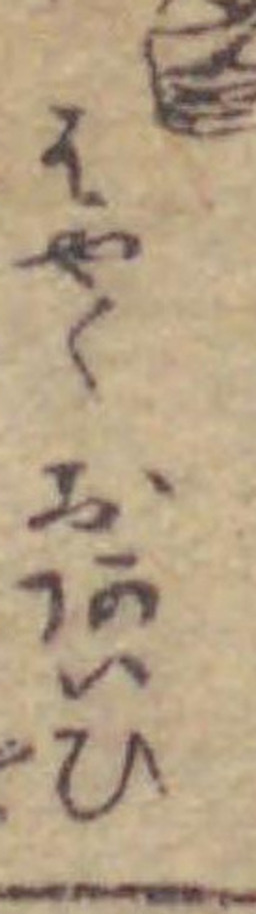はやくおあいひ
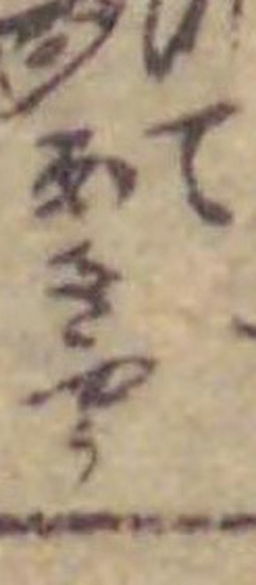あきやう
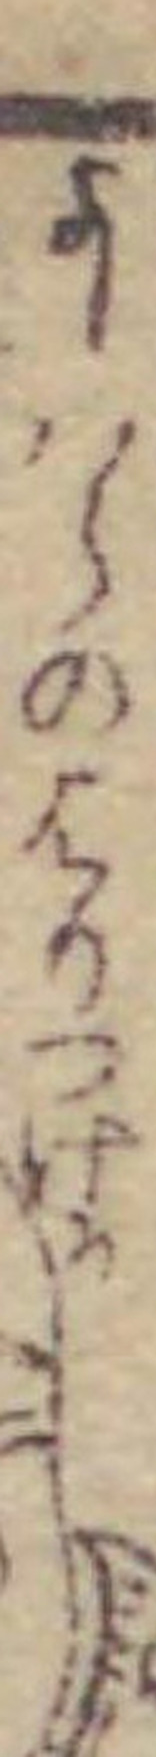よしはらのはりつけか
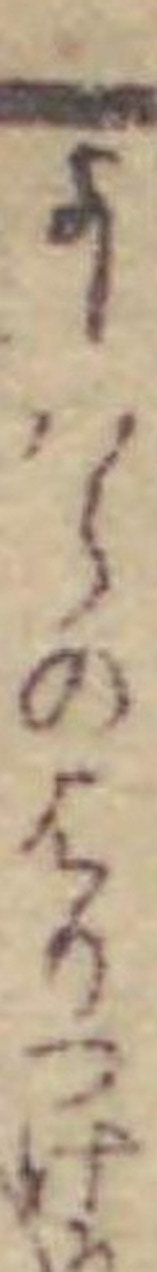よしはらのはりつけか
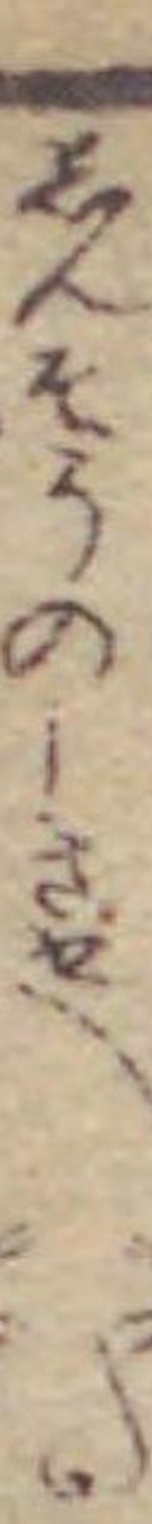しんそうのしきせ
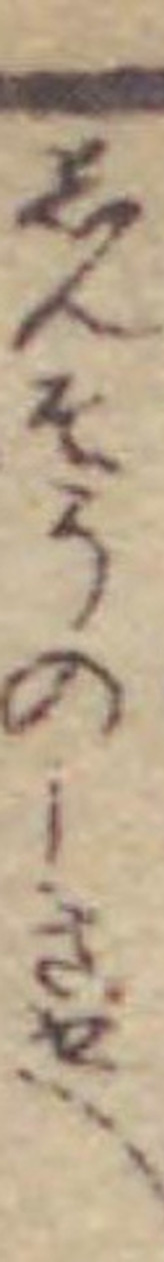しんそうのしきせ
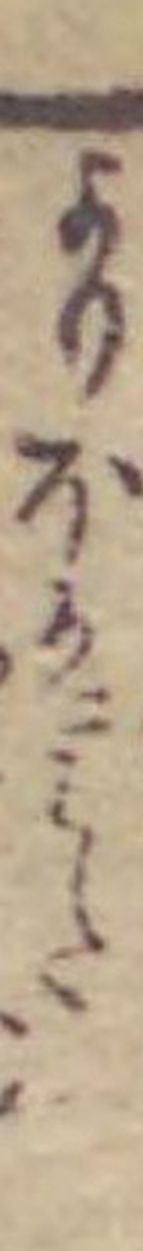よりほかにみた
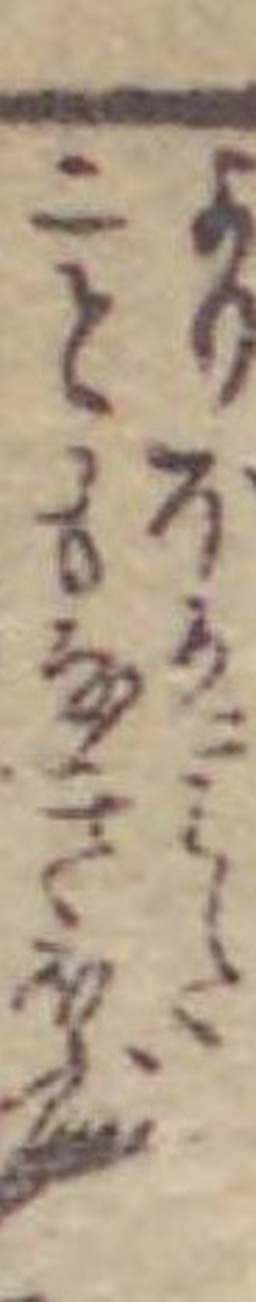こともなきほふ
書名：天下一面鏡梅鉢 : 3巻
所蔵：国立国会図書館 National Diet Library, JAPAN
